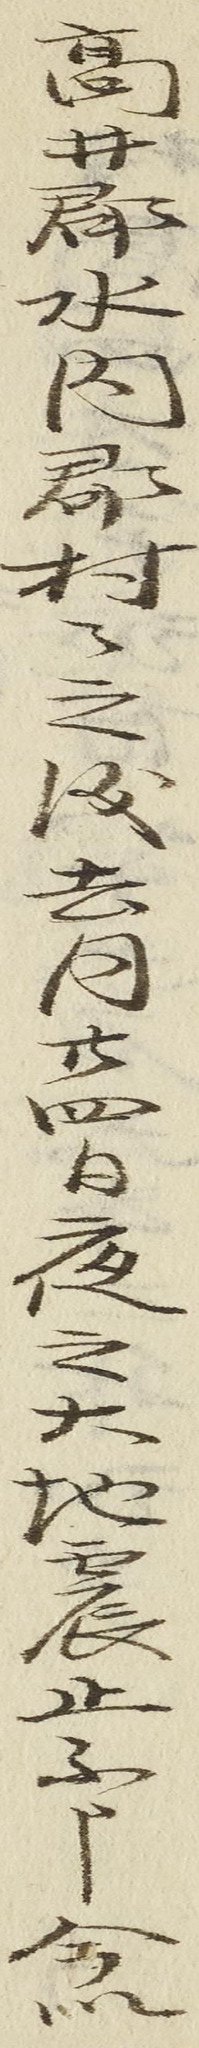高井郡水内郡村々之儀去月廿四日夜之大地震止不以
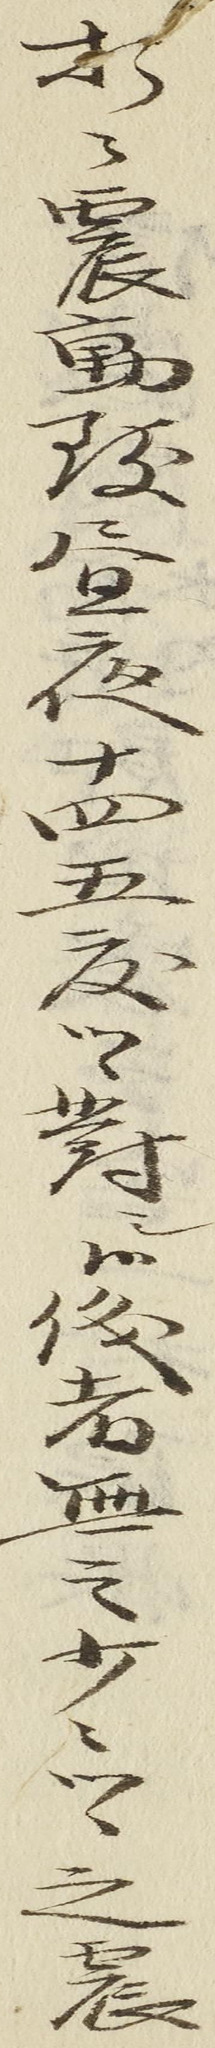折々震動致昼夜十四五度ツゝ対ㇱ候儀は無之少々ツゝ之震
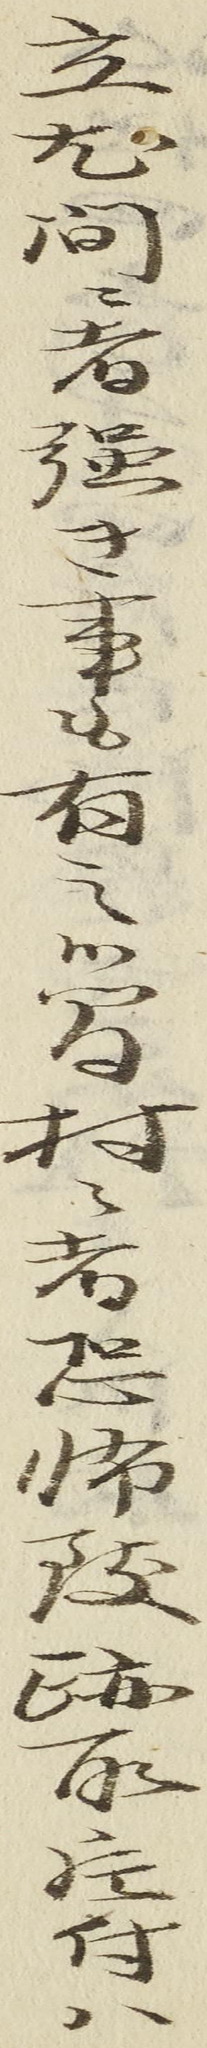立尤間二は強き事も有之候間村々は恐怖致し跡取片付ハ
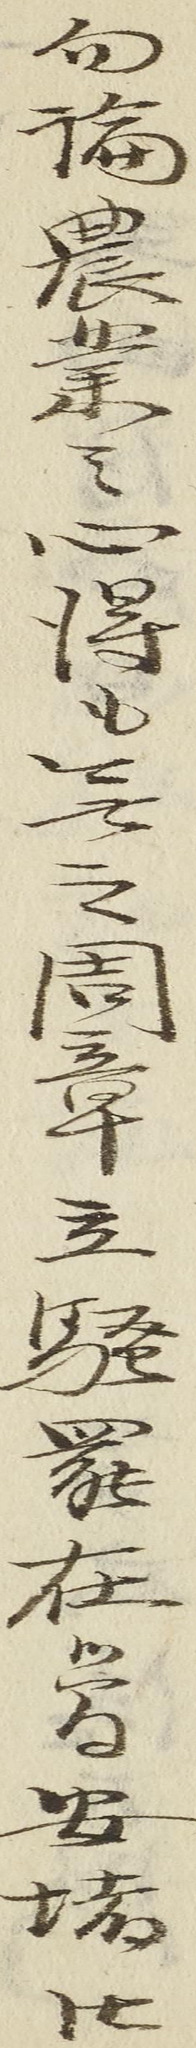勿論農業之心得も無之周章立騒罷在候間安堵仕
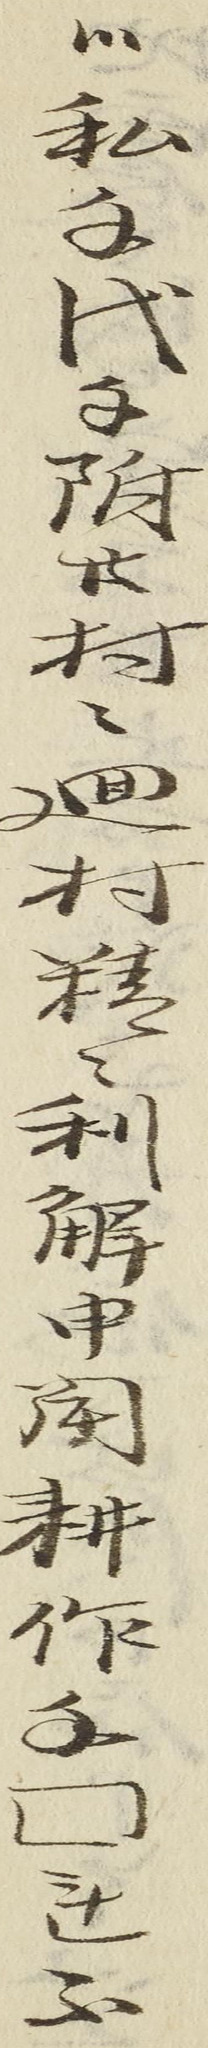候私手附手代共村々廻村精々利解申聞耕作手口れ不
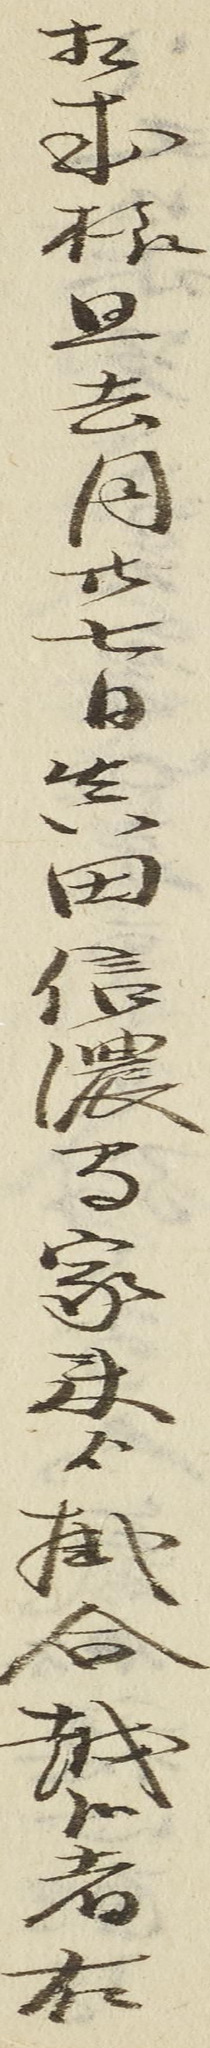相成様且去月廿七日真田信濃守家来ゟ掛合越候は右
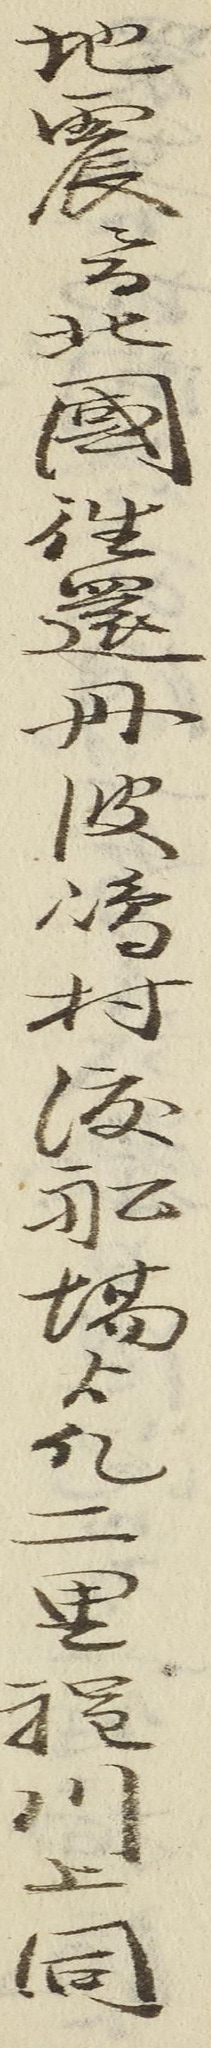地震二而北国往還丹波嶋村之渡船場ゟ凡二里程川上同
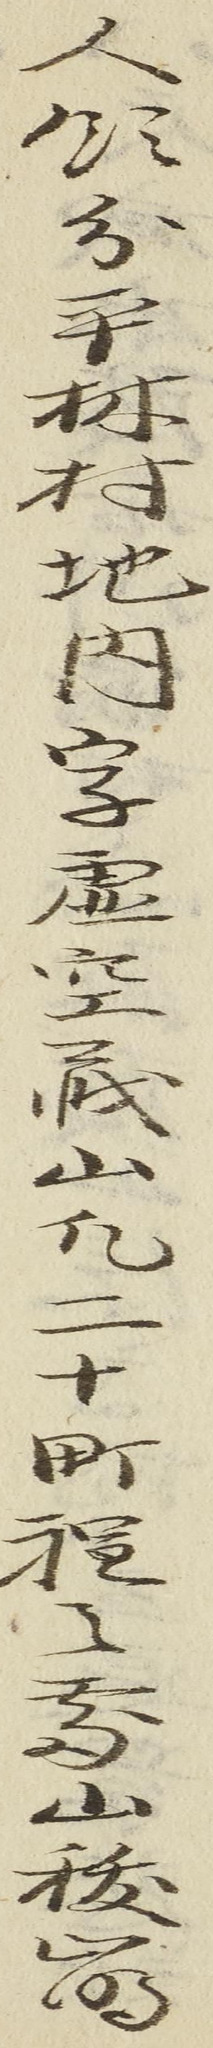人領分平林村地内字虚空蔵山凡二十町程之処山抜崩
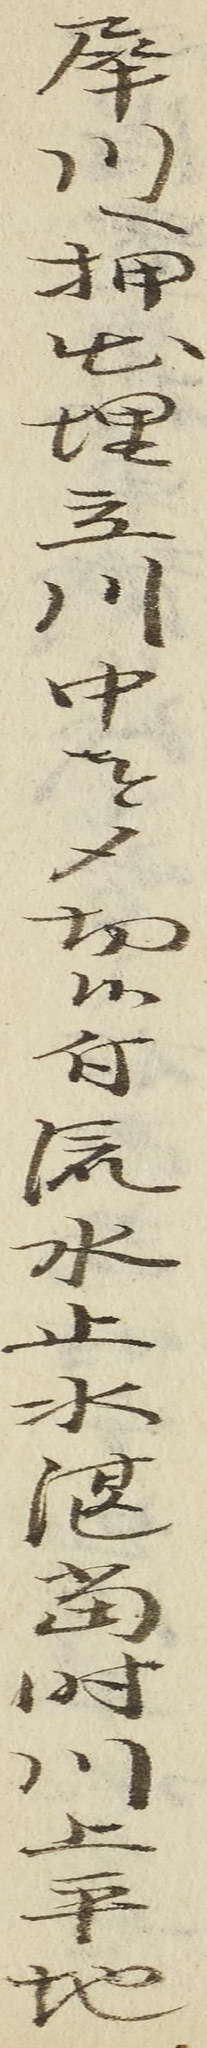犀川へ押出埋立川中を〆切候付流水止水湛当時川上平地
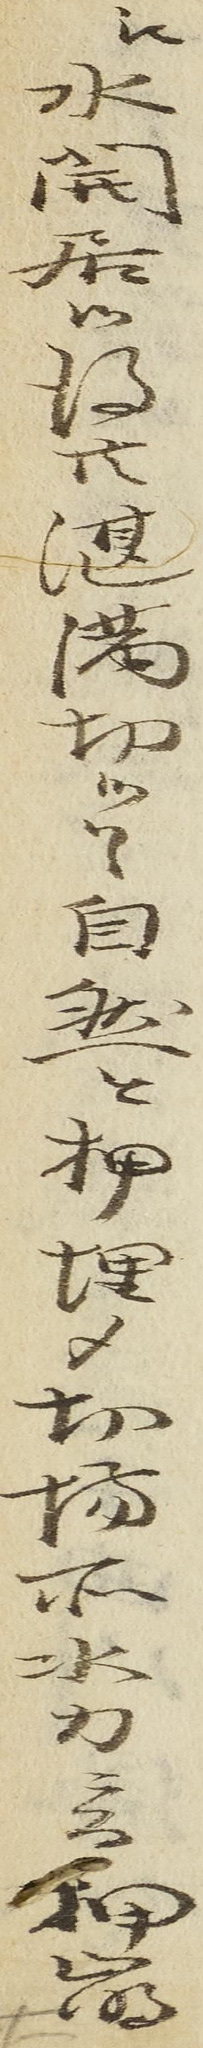江水開居候得共湛満切候ハゝ自然と押埋候〆切場所水力二而押崩

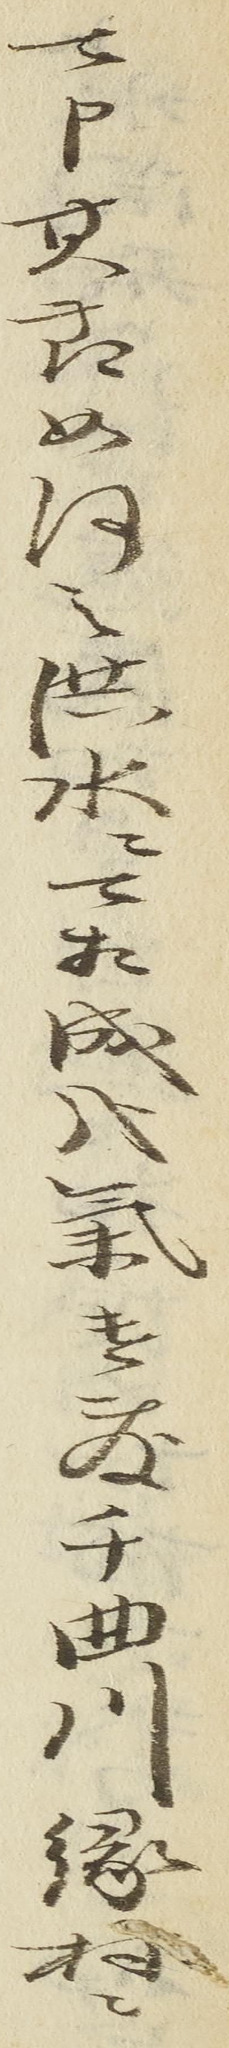可申其節如何之洪水二可相成哉気遣敷支配所千曲川縁村々
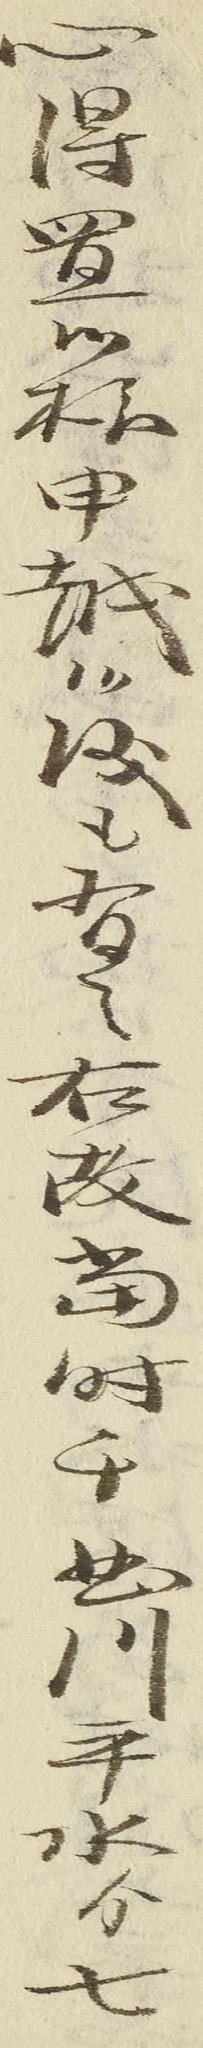心得置候様申越候儀も有之右故当時千曲川平水ゟ七
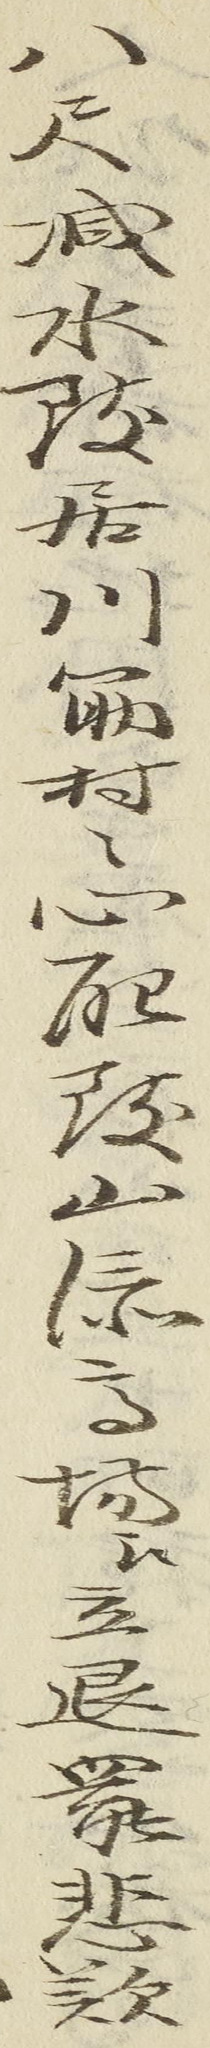八尺減水致居川筋村々心配致山添高場ㇸ立退罷悲歎
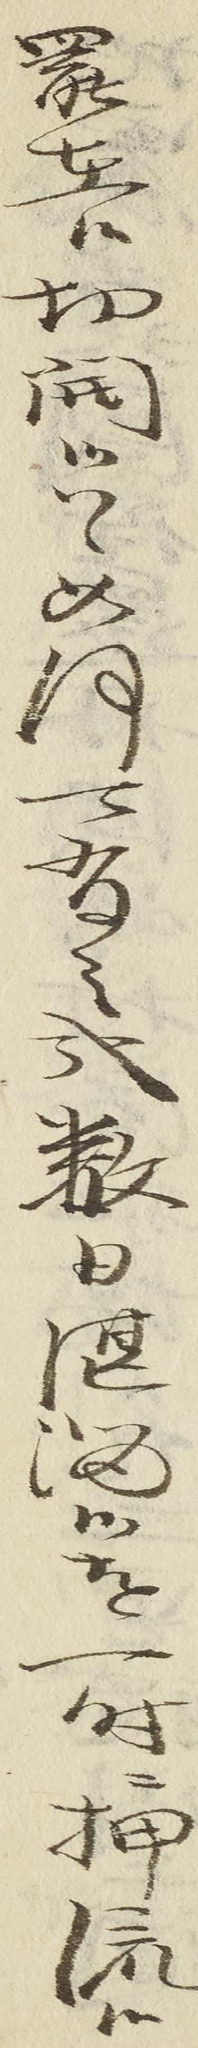罷在候切開候ハゝ如何可有之哉数日湛溜候を一時二押流候
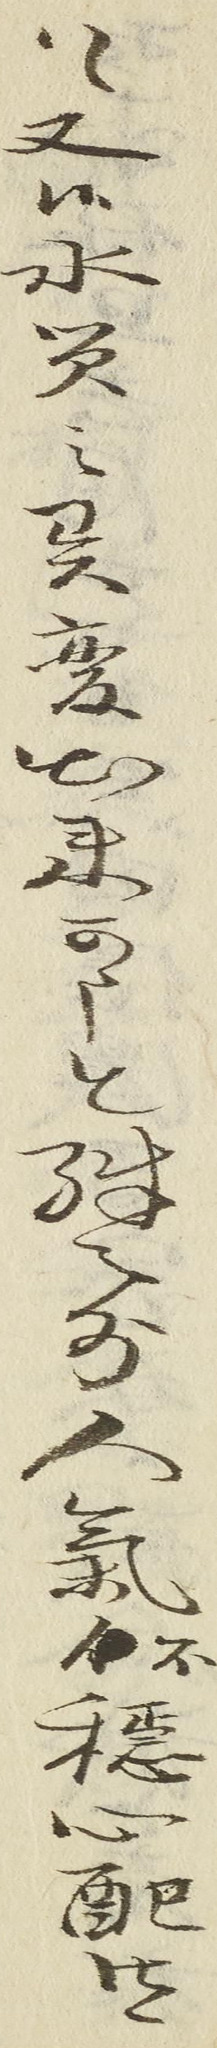ハゝ又候水災之異変出来可申と殊之外人気不穏心配仕候
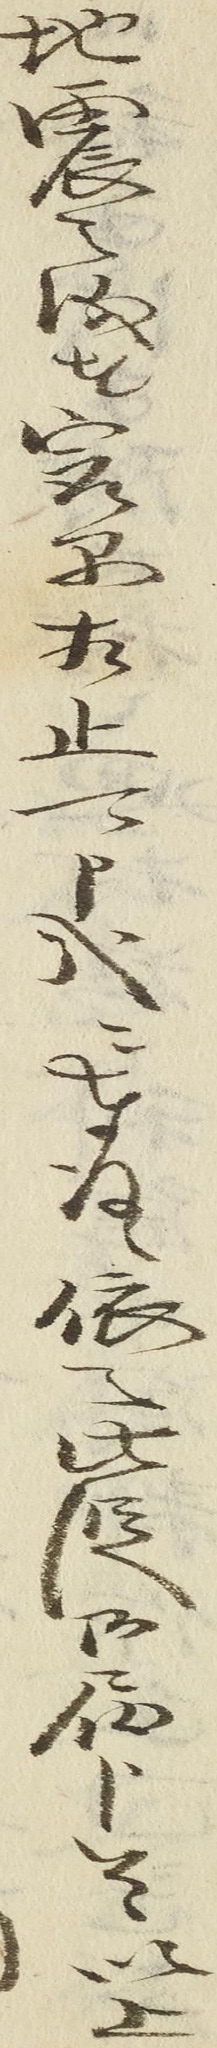地震之儀は最早相止可哉二奉存候依之此段御届申上候以上
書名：信濃國大地震記　乾
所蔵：東京大学地震研究所図書室 Earthquake Research Institute Library, The University of Tokyo, JAPAN
